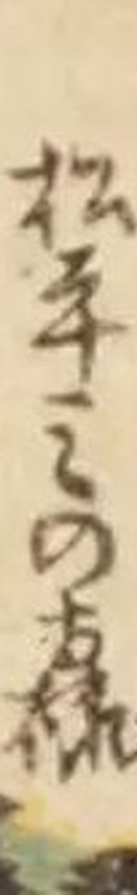松平みの守様
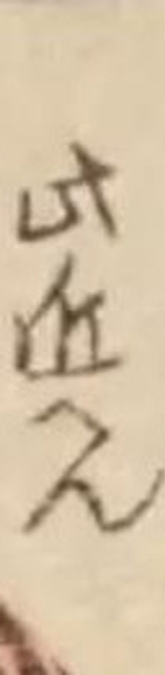此近へん
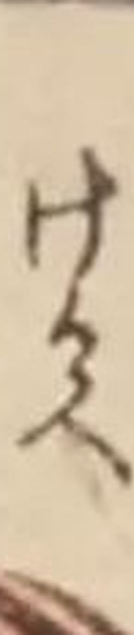けか人
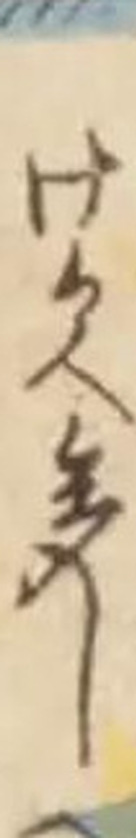けか人多し
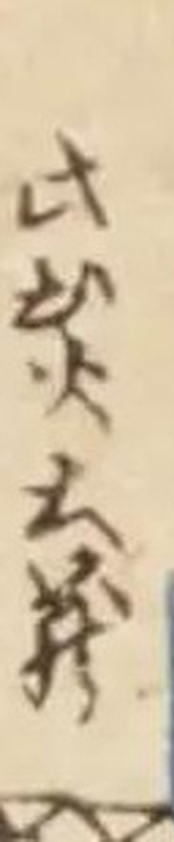此出火土蔵
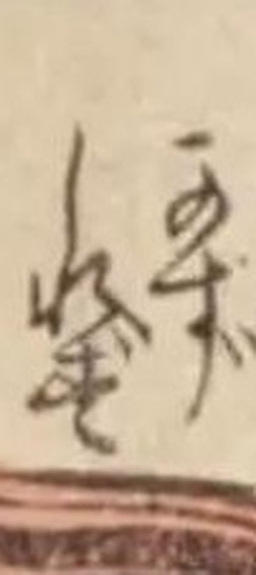しれず
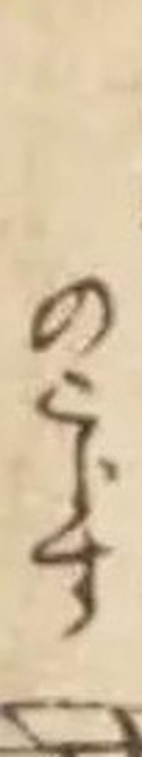のこらず
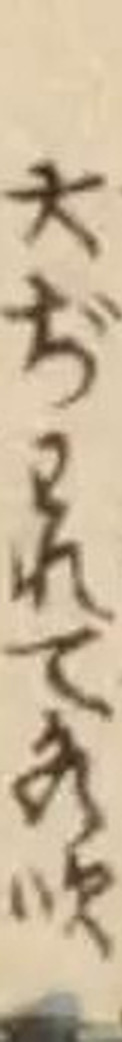大ぢわれて水吹
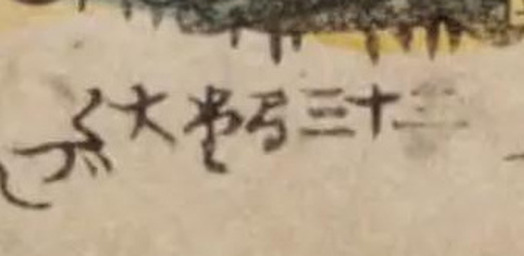〇十二
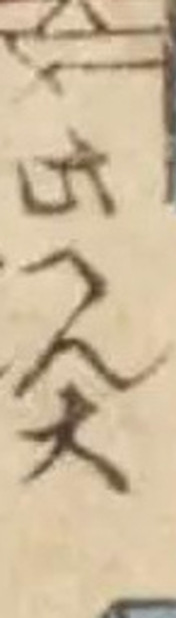此へん大
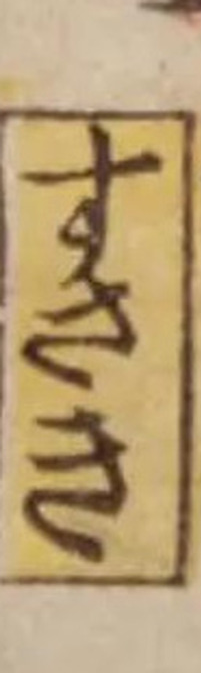○さき
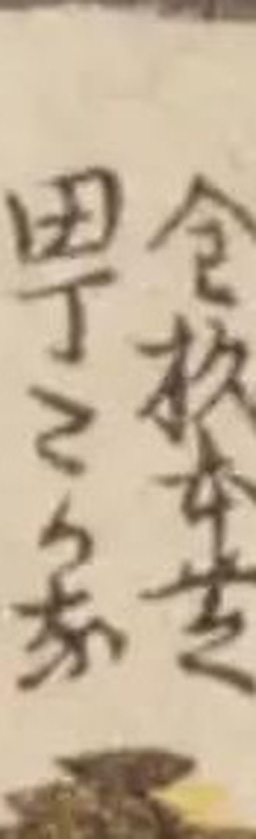田丁たかな
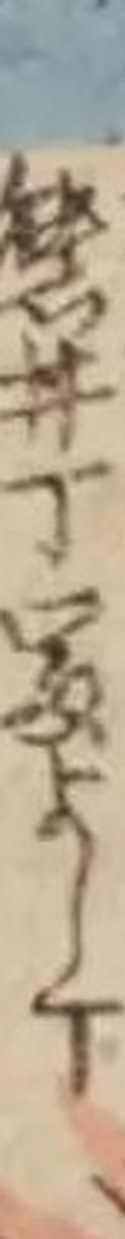熊井丁富よし丁
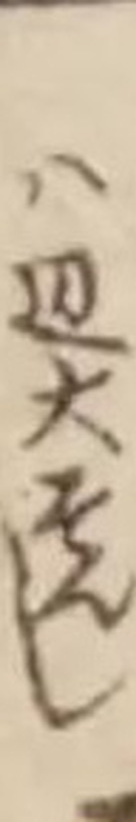は辺大そんじ
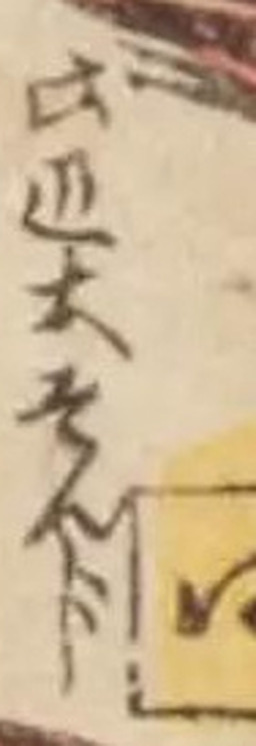は辺大そんじ
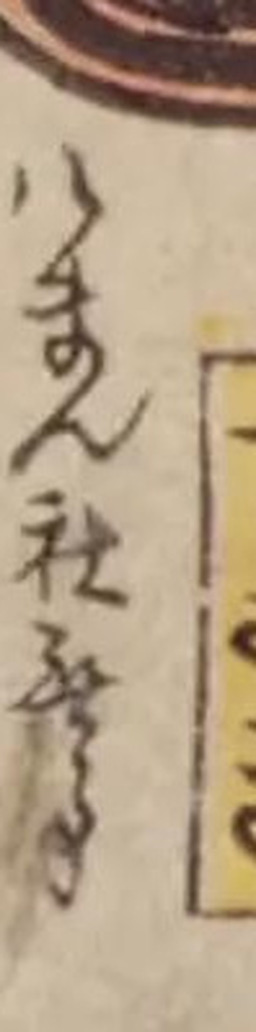八まん社無付
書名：銘細改板江戸大地震出火場所附
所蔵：国立国会図書館 National Diet Library, JAPAN
